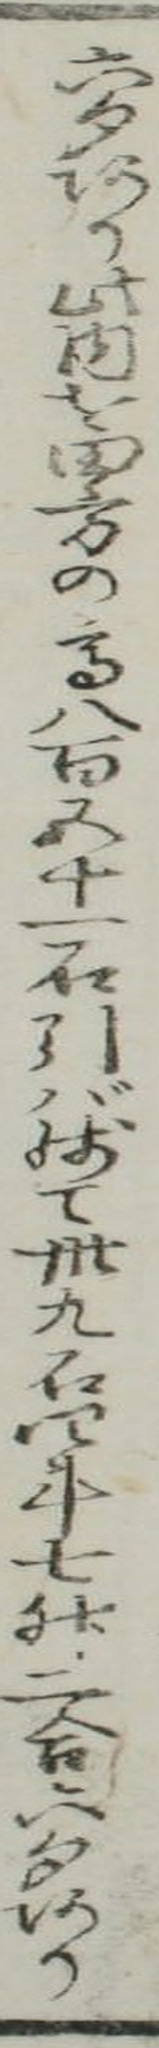六勺あり此内を田方の高八百五十一石引ば残て卅九石四斗七升二合六勺あり
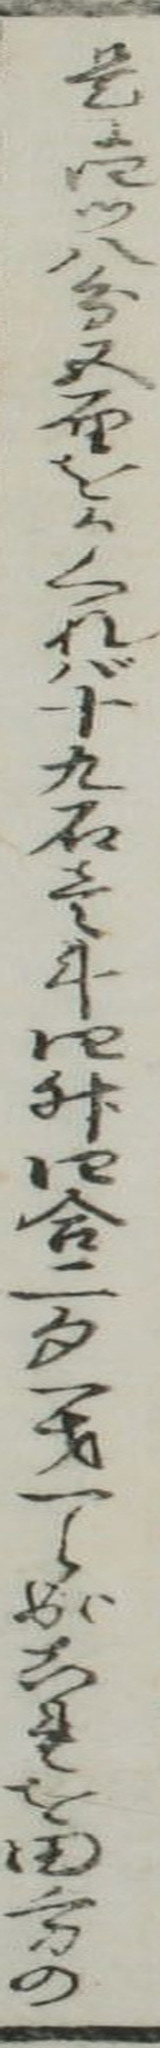是に四ツ八分五厘をかくれば十九石壱斗四升四合二勺一才一成これを田法の

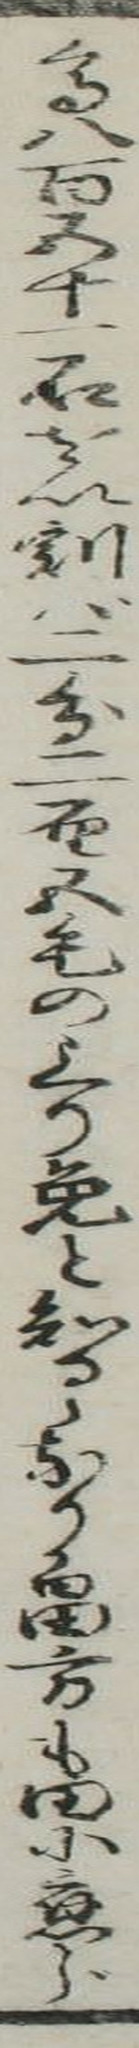高八百五十一石を以割ば二分二厘五毛の上り免と知るゝなり畠方も田に応じ
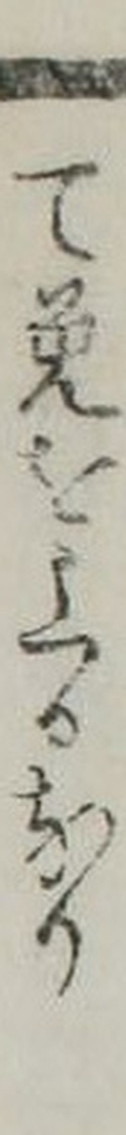て免を上るなり
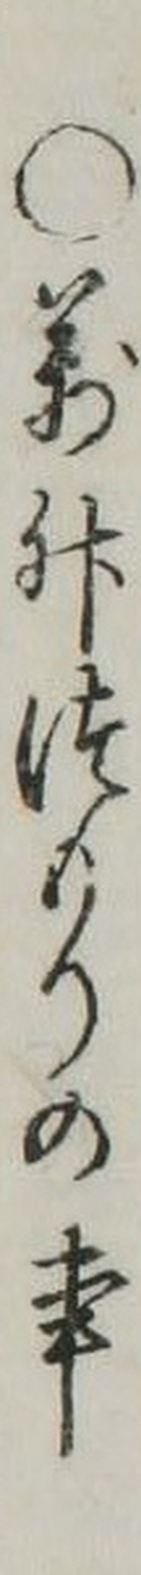○万升つもりの事
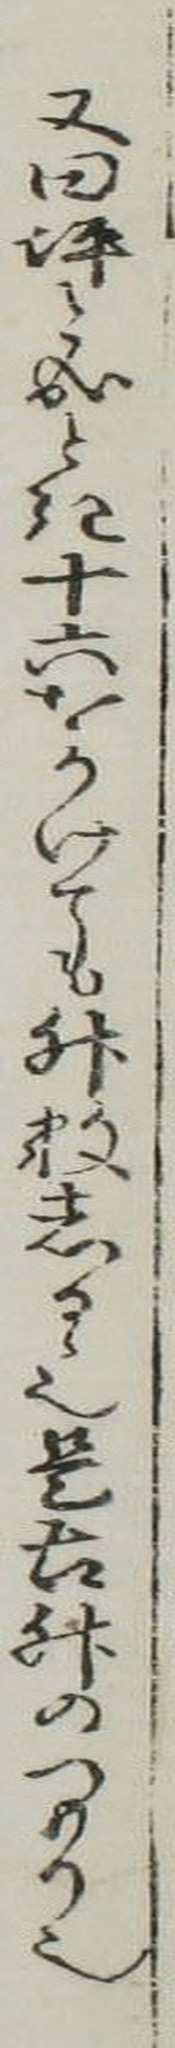又曰坪と成とき十六をかけても升数しるゝ也是古升のつもり也
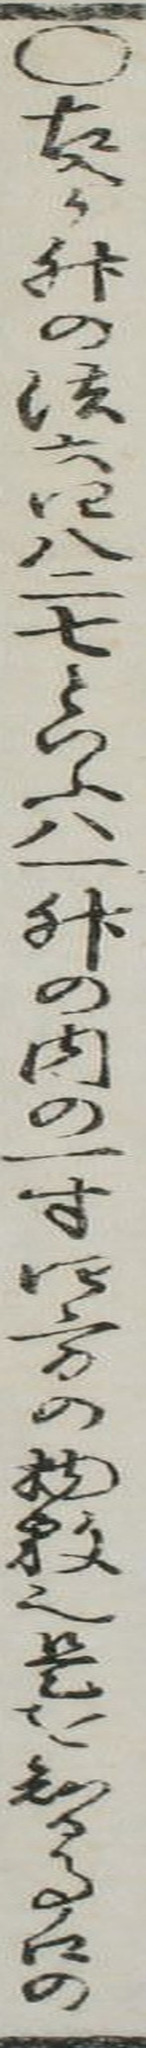○右入り升の法六四八二七といふは一升の内の一寸四方の物数也是を知る事口の
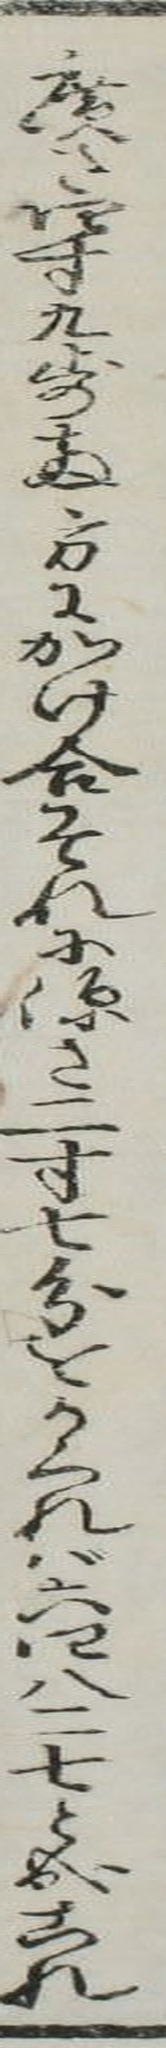広さ四寸九歩両方にかけ合それに深さ二寸七分をかくれば六四八二七と成これ
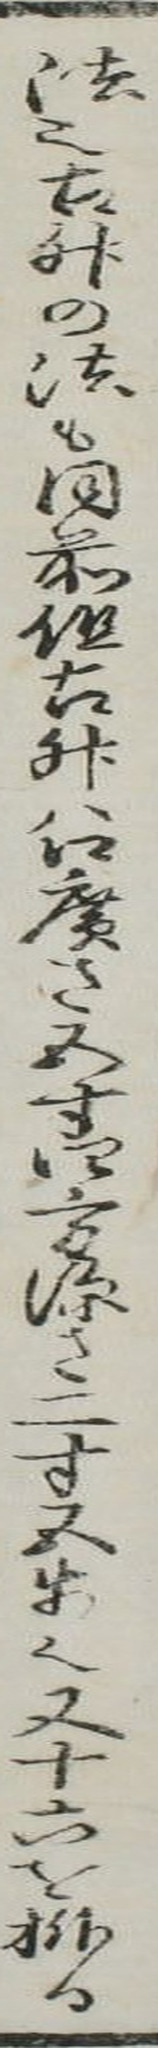法也古升の法も同前但古升は口広さ五寸四方深さ二寸五歩也又十六を掛る
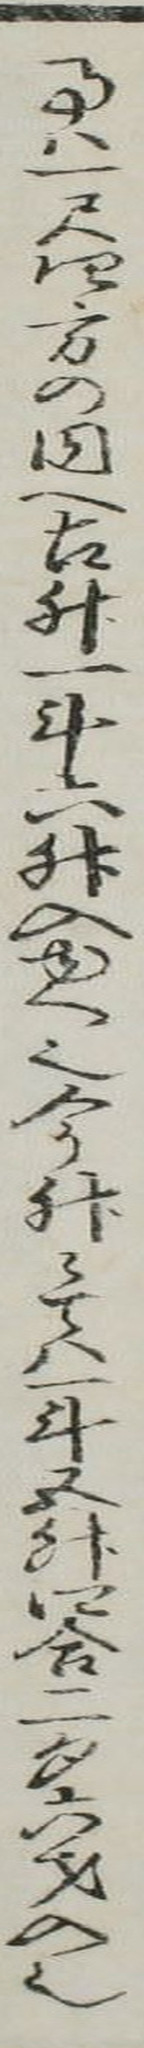事は一尺四方の内へ古升一斗六升入ゆへ也今升にては一斗五升四合二勺六才入也
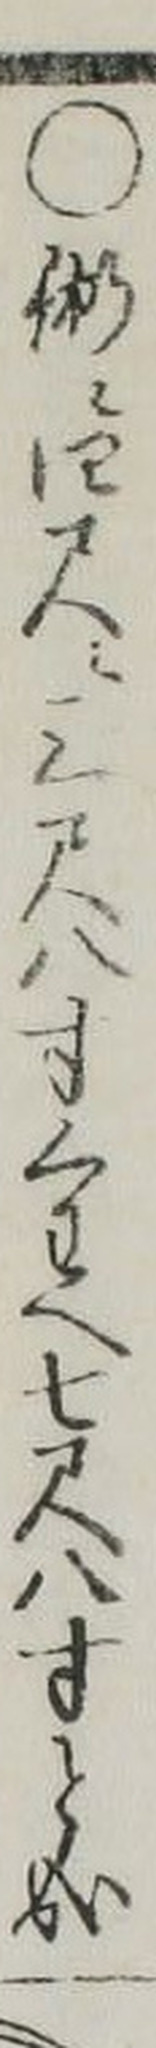○術に四尺に三尺八寸くわへ七尺八寸と成
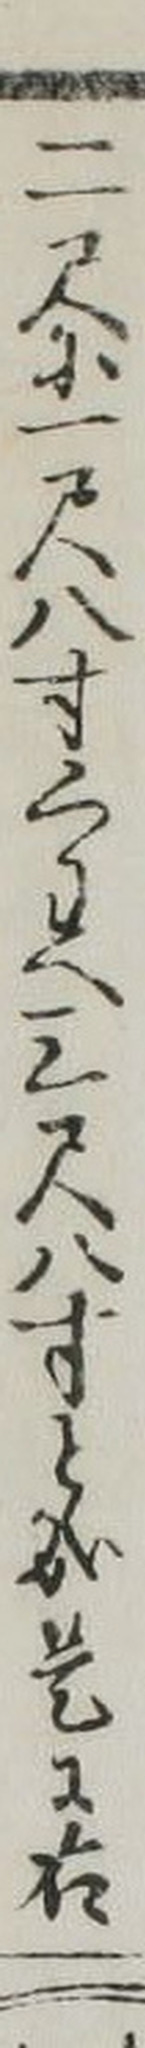二尺に一尺八寸くわへ三尺八寸と成此是に右
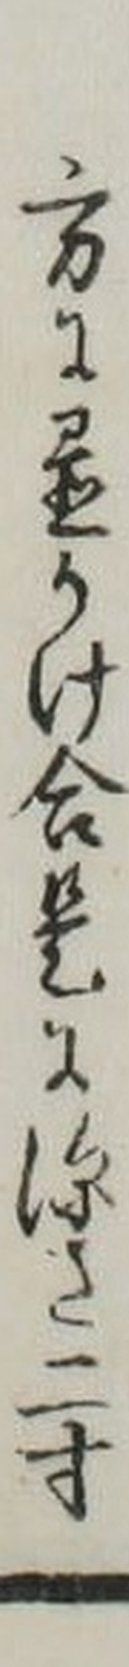九一寸方に置かけ合是に深さ二寸
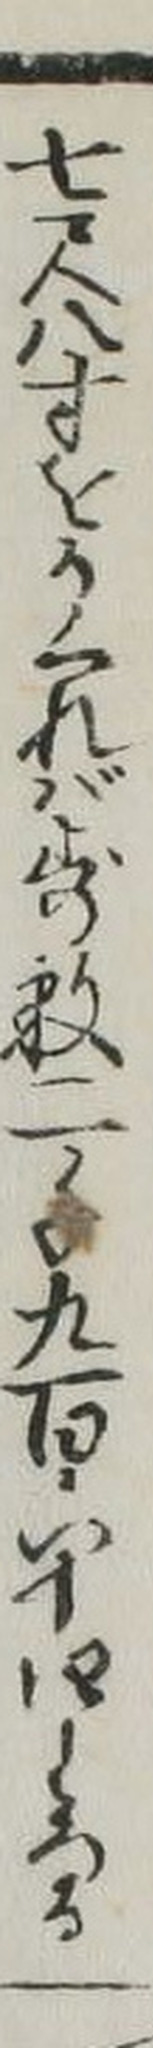七尺八寸をかくれば歩数二千九百六十四となる
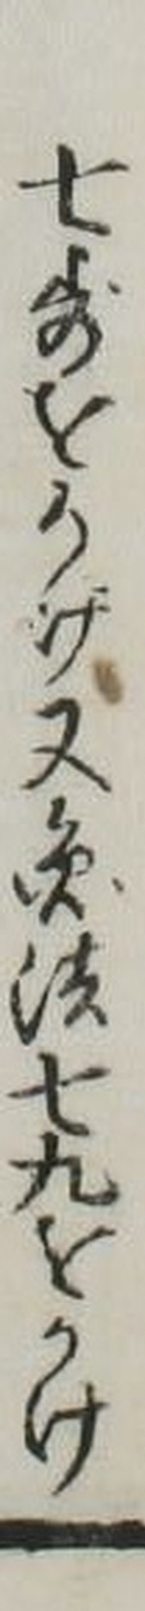寸一分七歩をかけ又円法七九をかけ
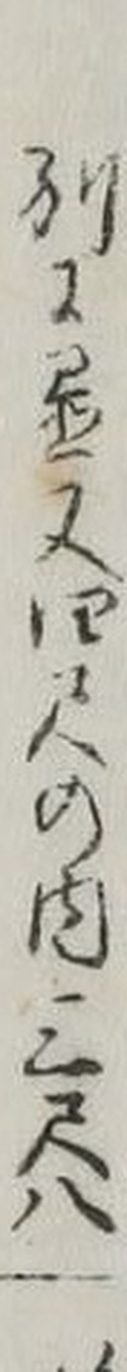ふさ三別に置又四尺の内三尺八
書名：宝玉塵劫記
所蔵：東京学芸大学教育コンテンツアーカイブ
